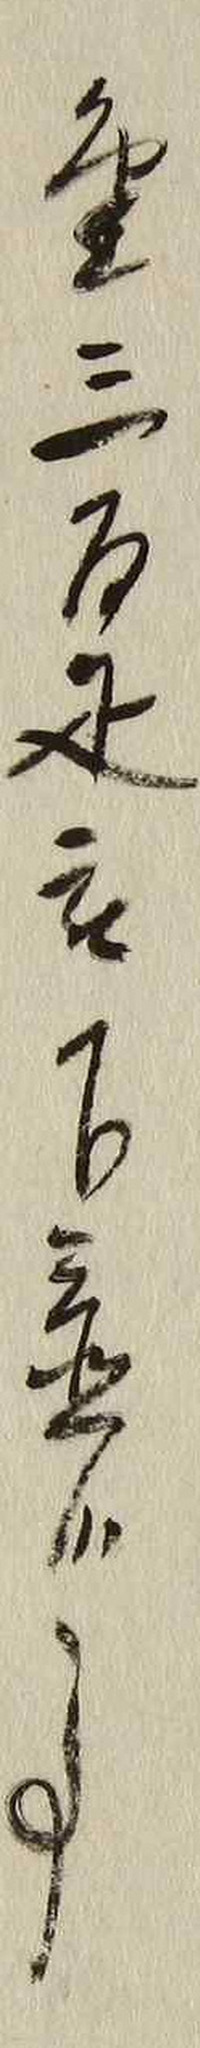金三百疋被下置候事
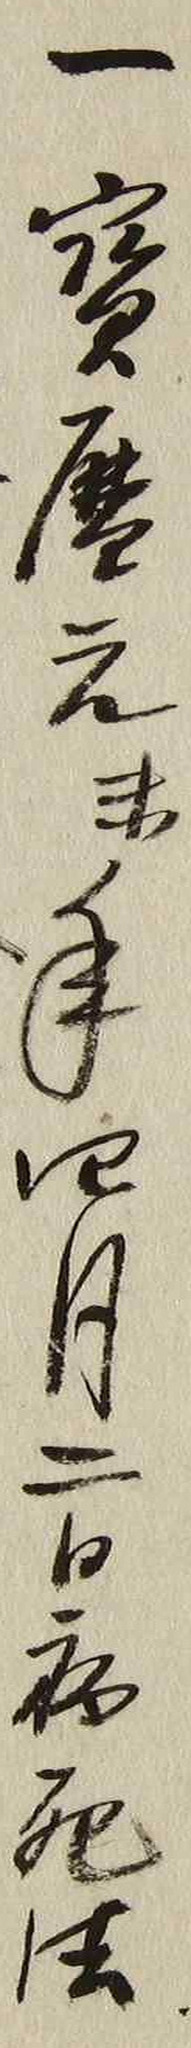一宝暦元未年四月二日病死法
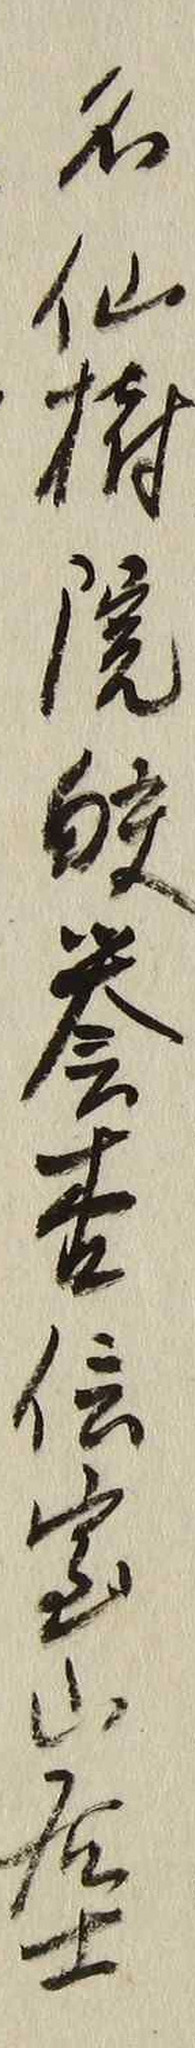名仙樹院皎誉杏信室山居士
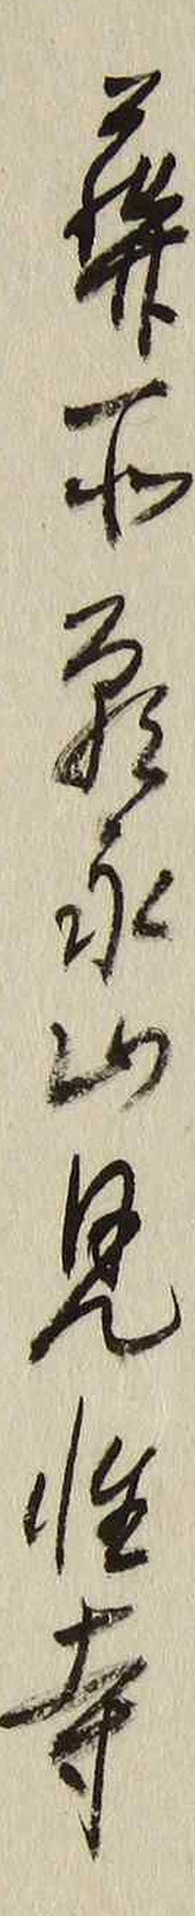葬所願永山見性寺
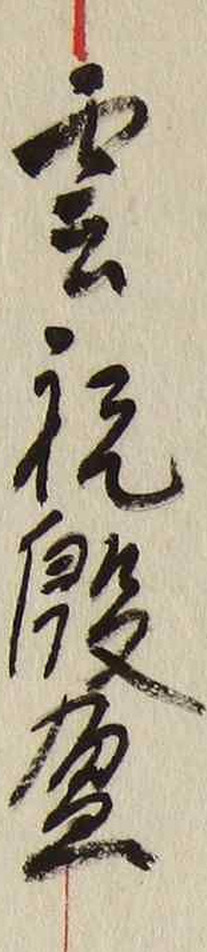雲祝殷盈

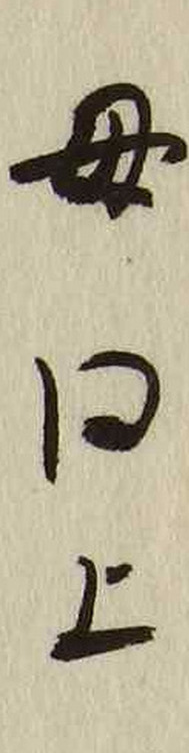母同上
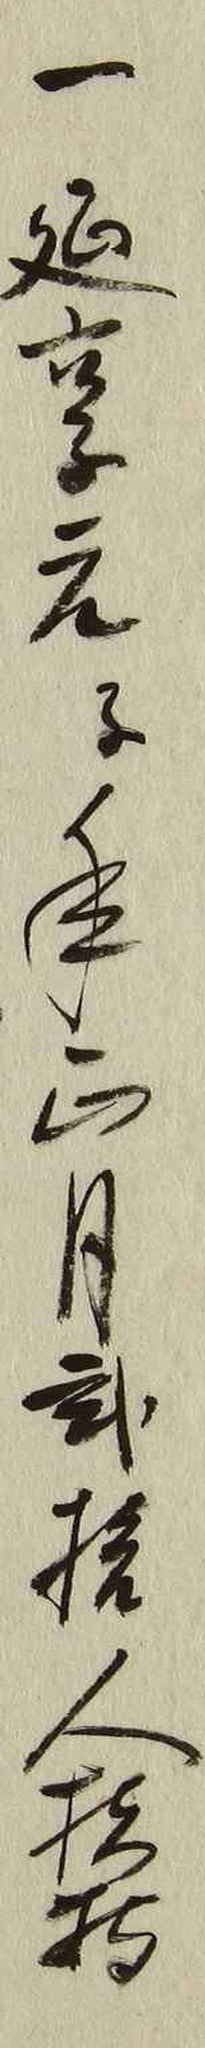一延享元子年正月弐拾人扶持
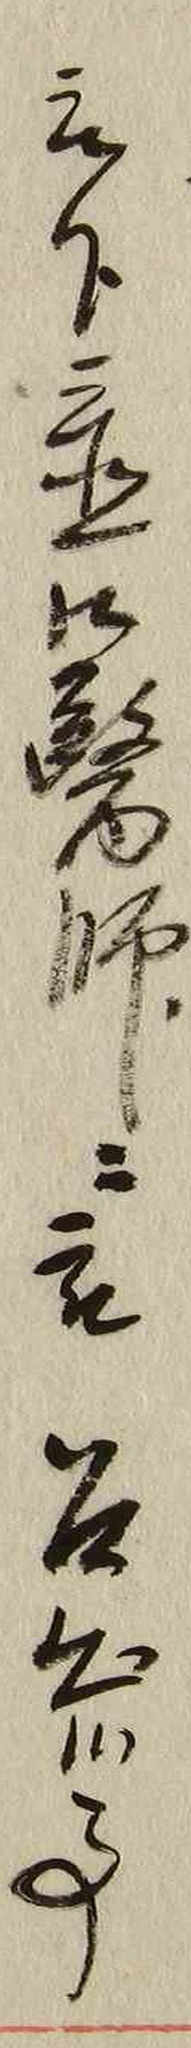被下置御医師ニ被召出候事
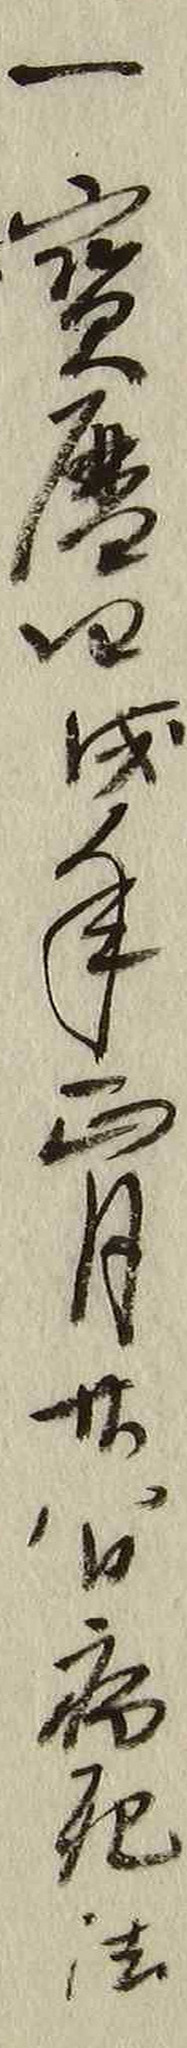一宝暦四戌年正月廿八日病死法
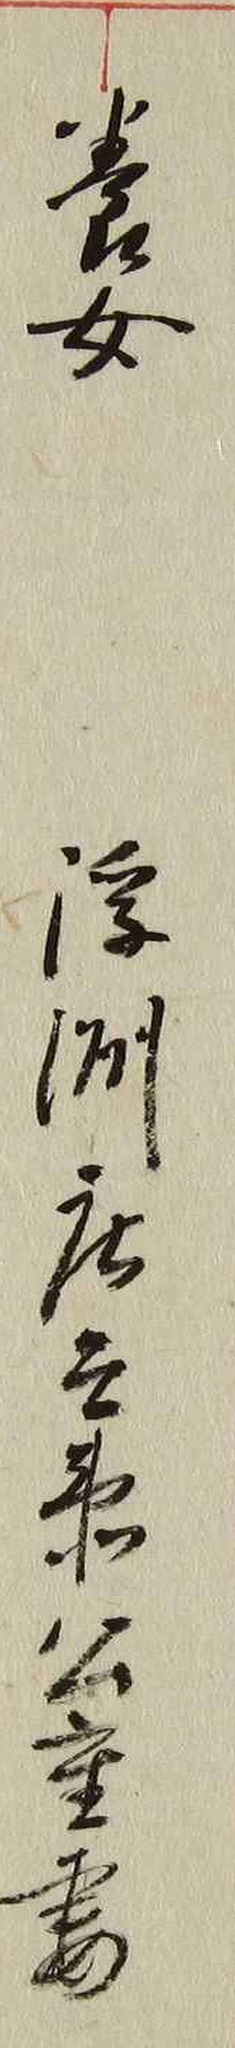養女浮洲庄兵衛公重妻
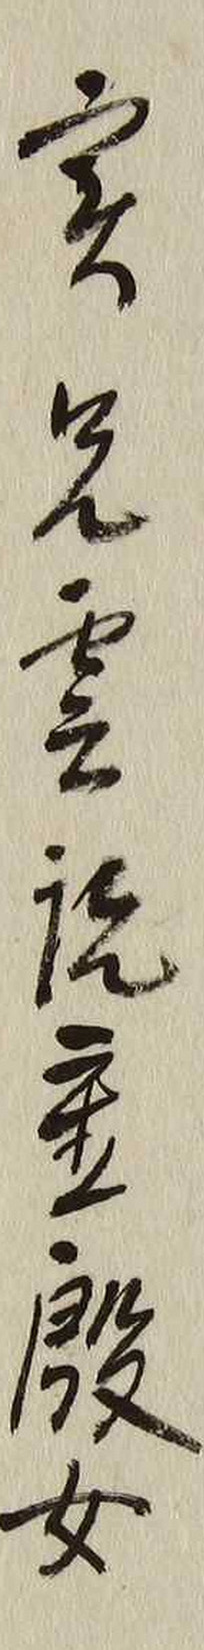実兄雲説重殷女
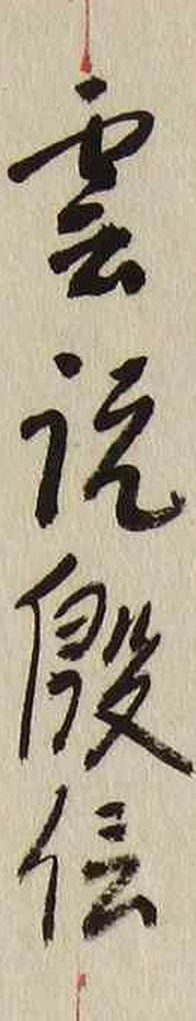雲説殷信
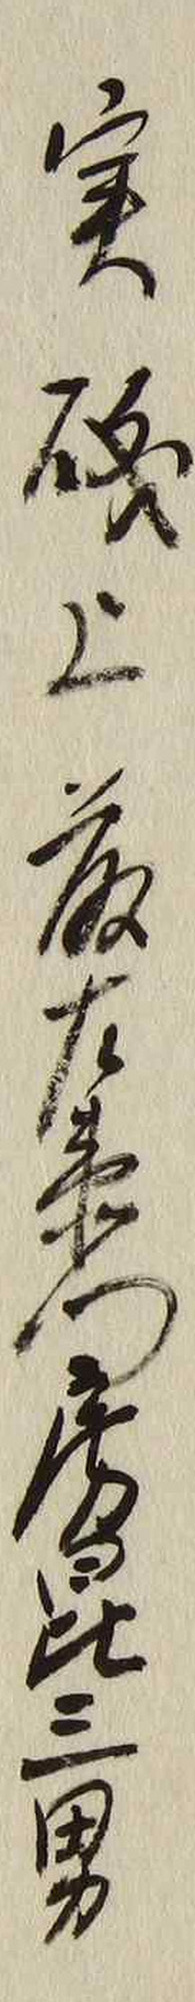実磯上藤左衛門房昆三男
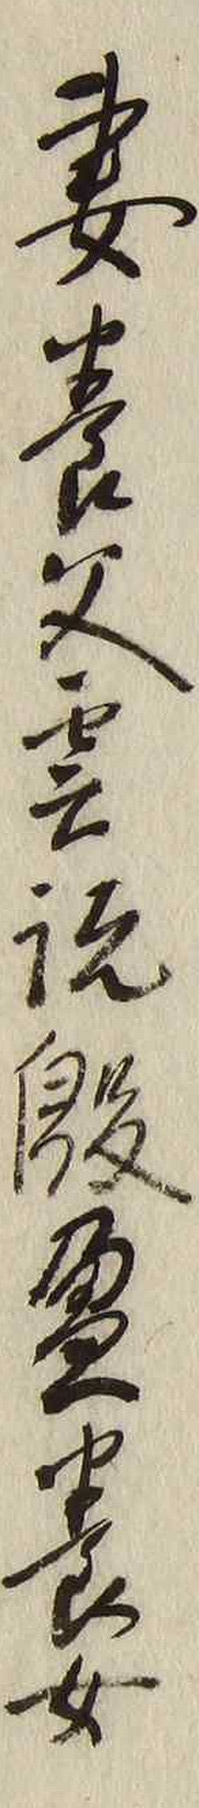妻養父雲説殷盈養女

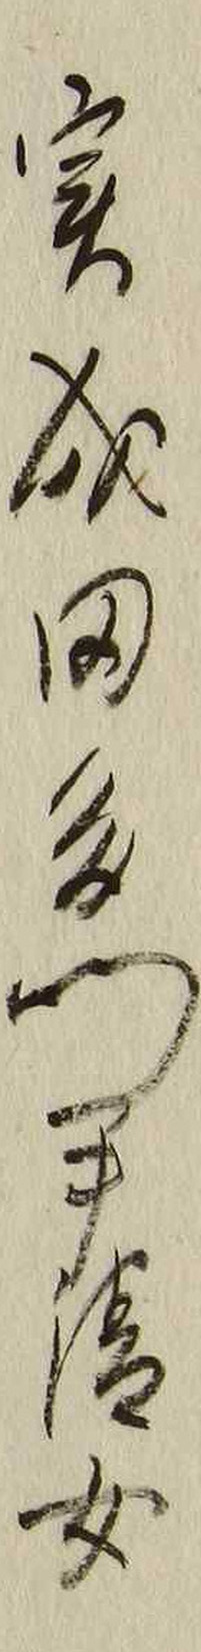実成田多門尹清女
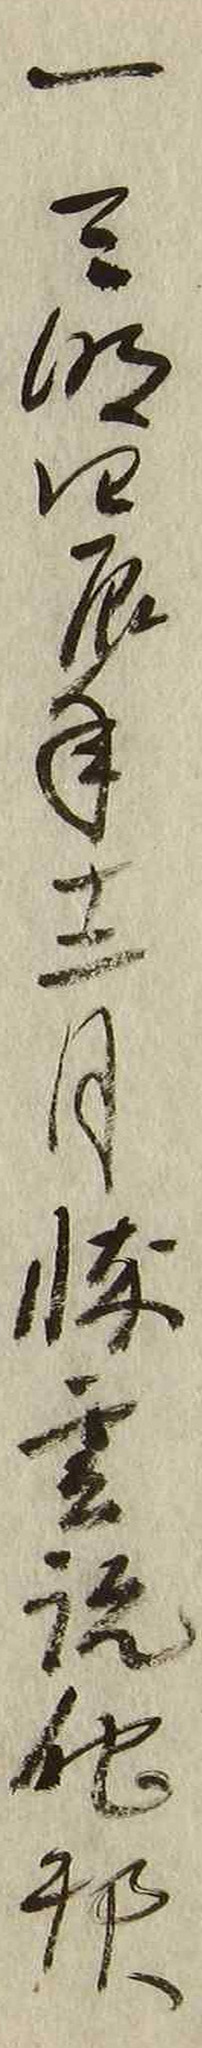一天明四辰年十二月忰雲説他邦へ
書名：諸士系譜　巻之353　す之部3
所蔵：会津若松市立会津図書館
